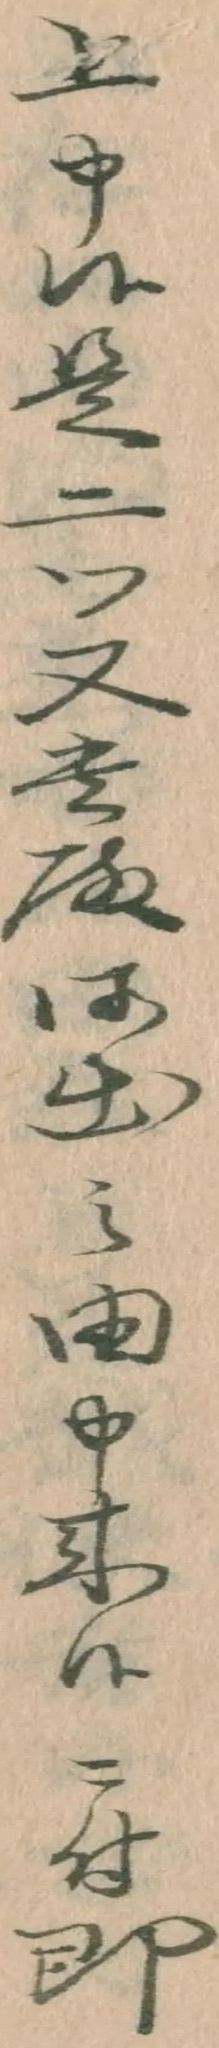上申候是二つ又貴殿御出之由申来候に付即
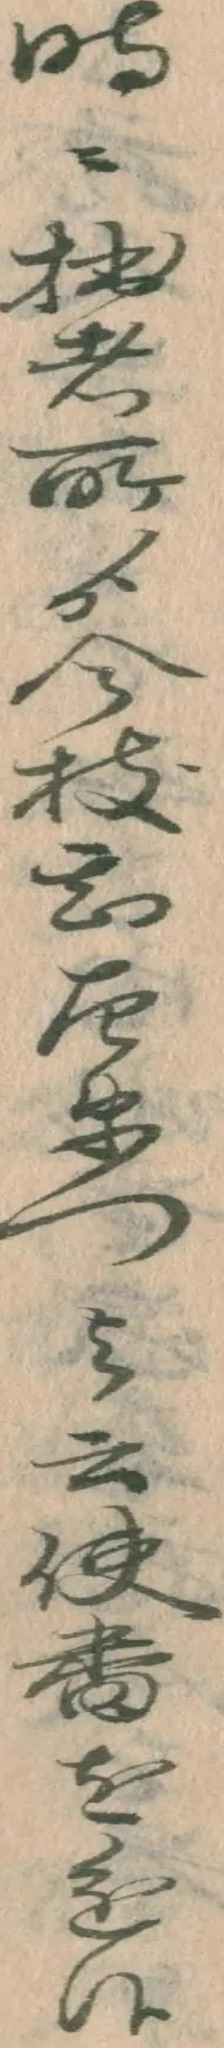時に拙者所ゟ今枝甚左衛門与云使番を進候
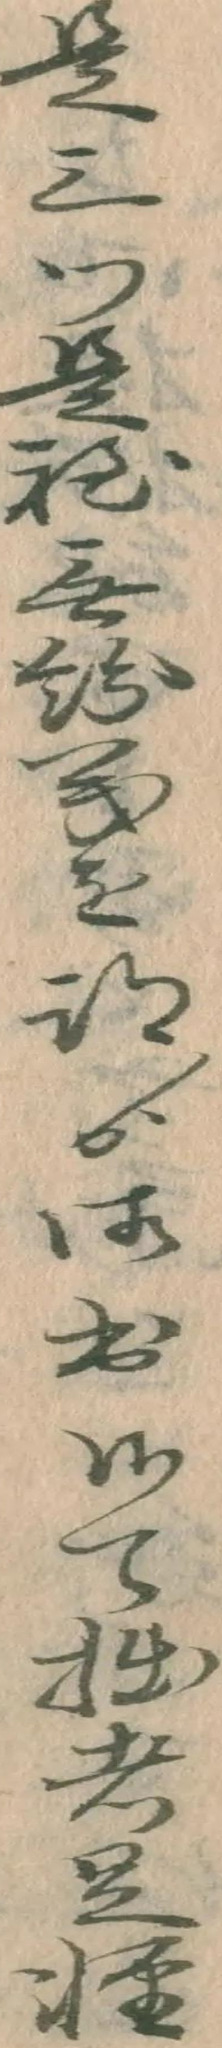是三つ是程無紛義を跡ゟ御出候て拙者足軽
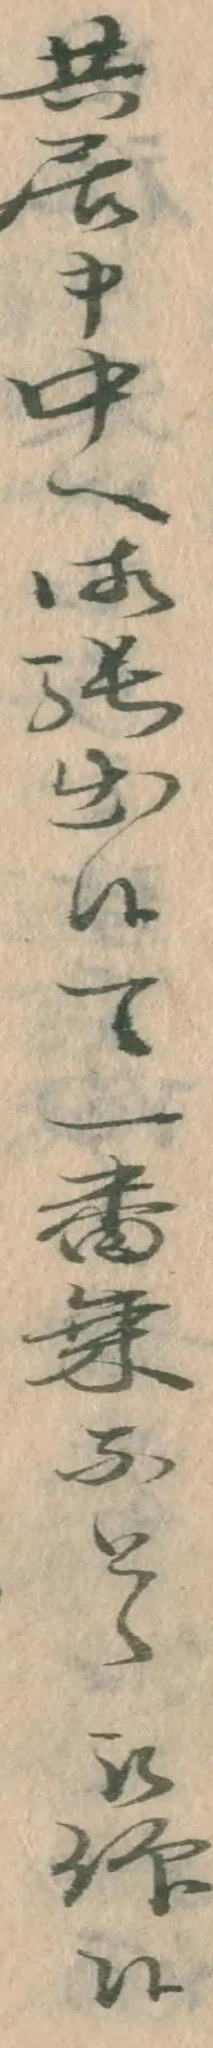共居申中へ御張出候て一番乗なとゝ被仰候
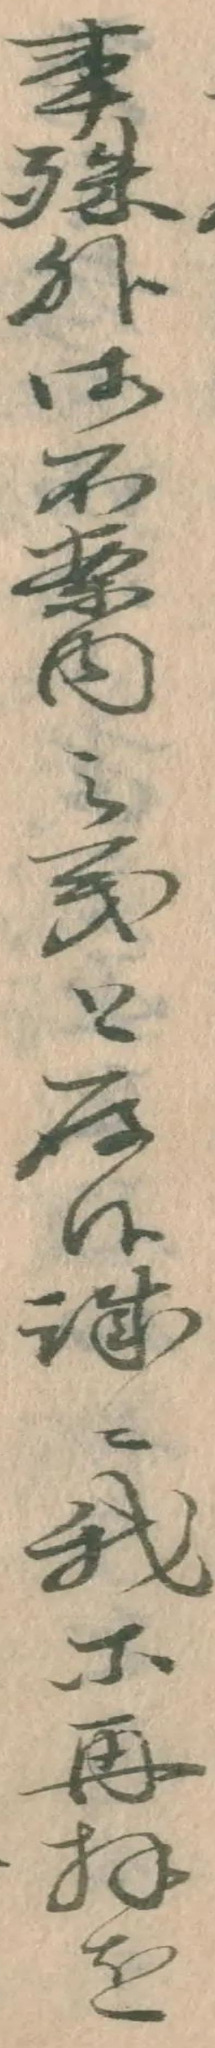事殊外御不案内之義と存候誠に我等再拝を
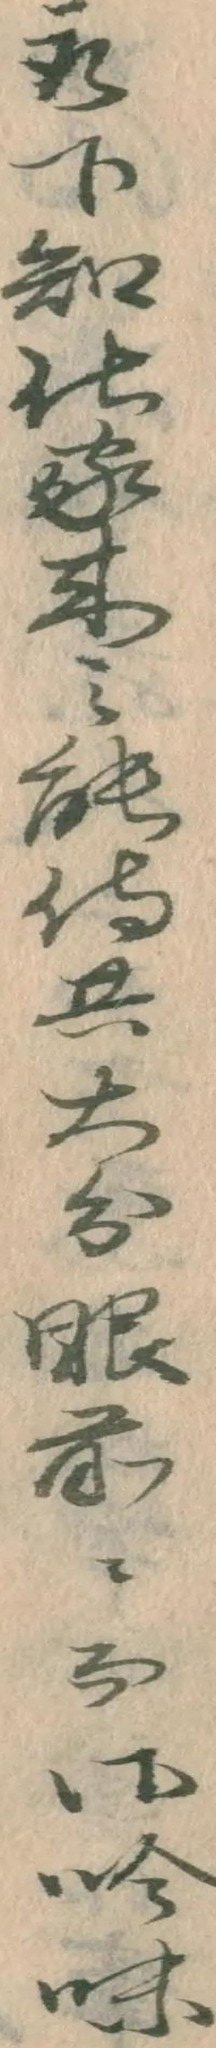取下知仕家来之能侍共大分眼前に而御吟味
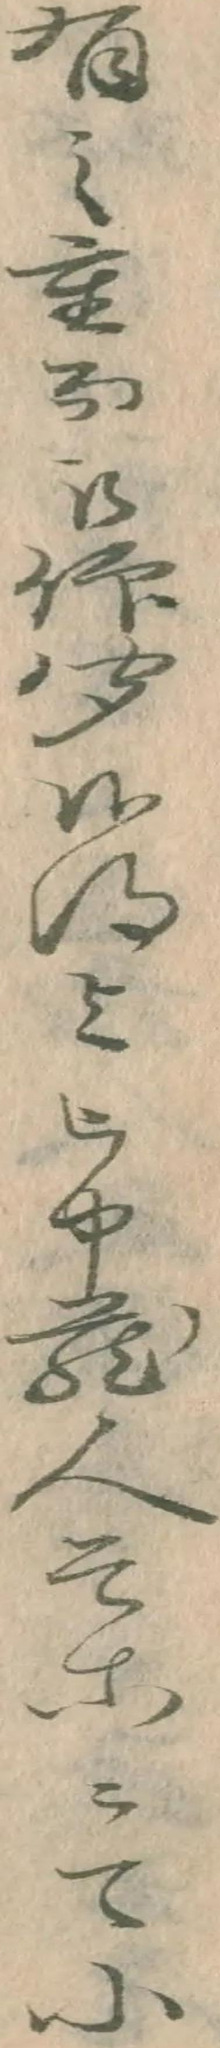有之重而被仰聞候得与被申蔵人そ古にて小
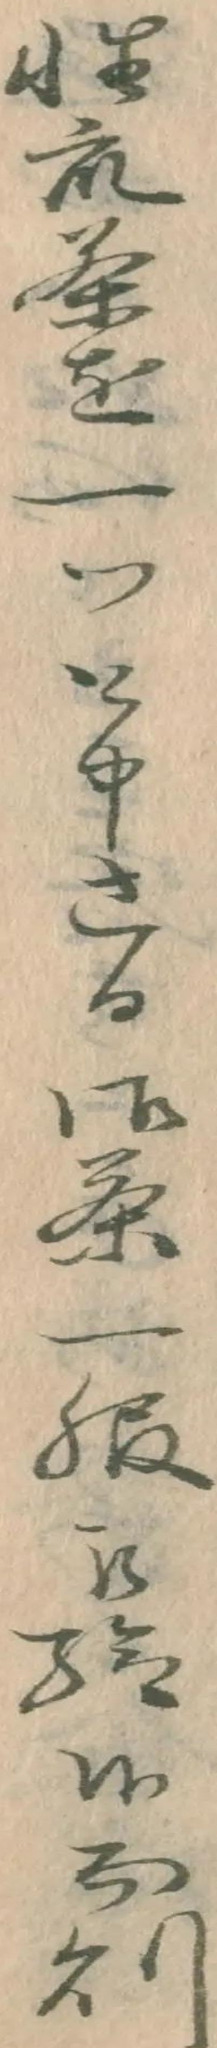姓衆茶を一つと申さる御茶一服被給候而則

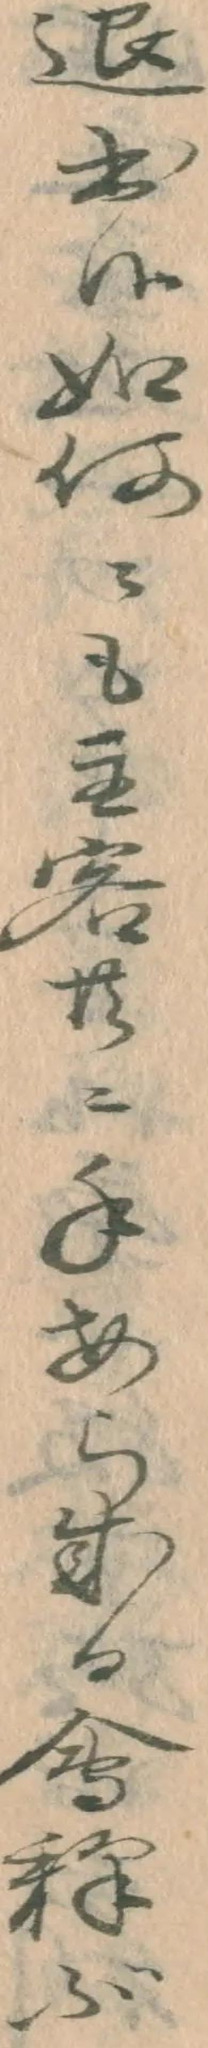退出候如何にも主客共に手あら成る会釈ぶ
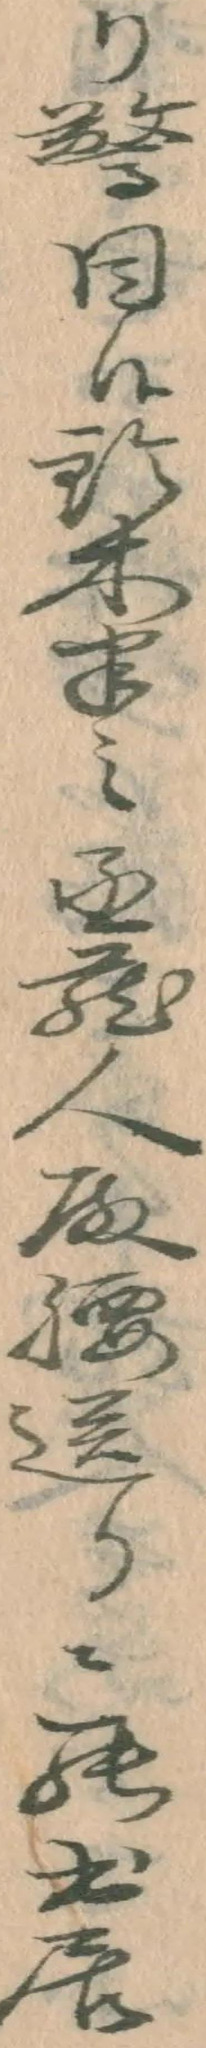り驚目候鈴木半之丞蔵人殿腰送りに罷出居
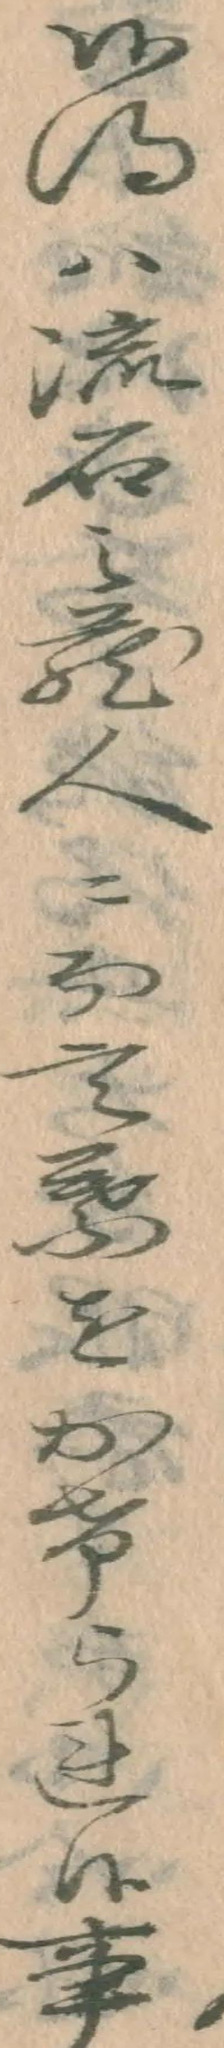候得は流石之蔵人に而言葉をか希ら連候事
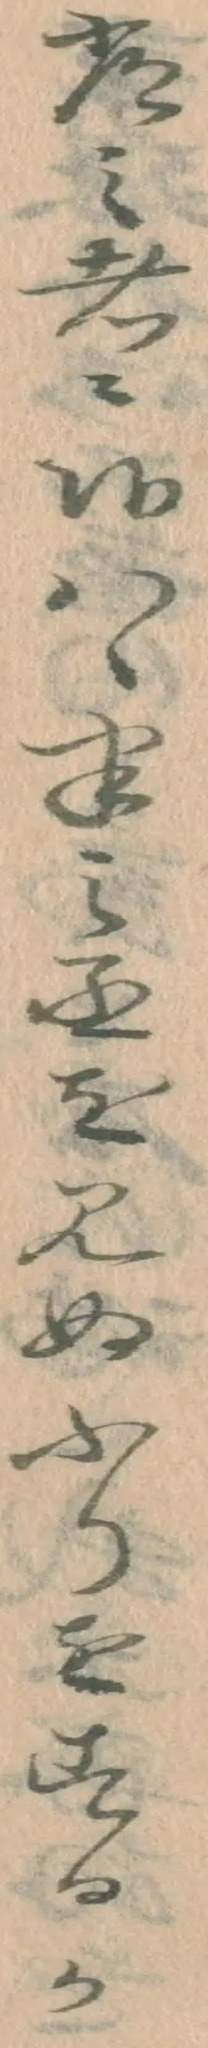常之者に候はゝ半之丞を見ぬふりを春るか
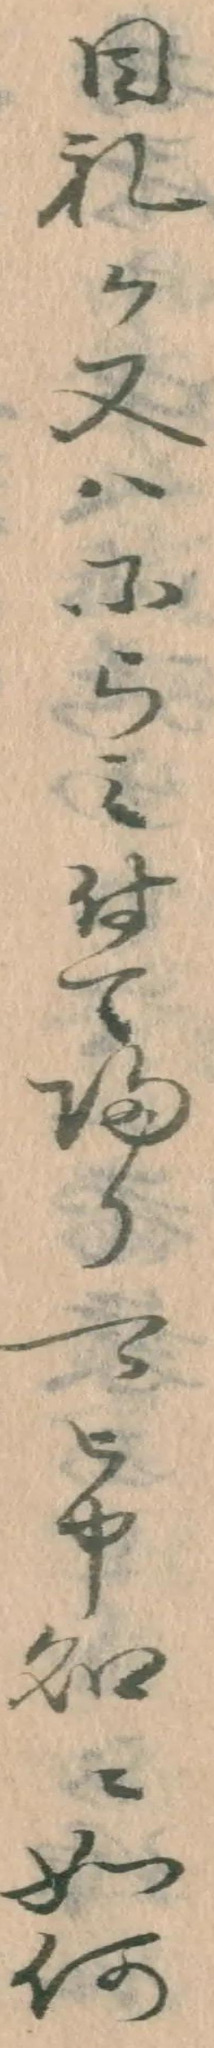目礼か又は尓らみ付て帰り可被申処に如何
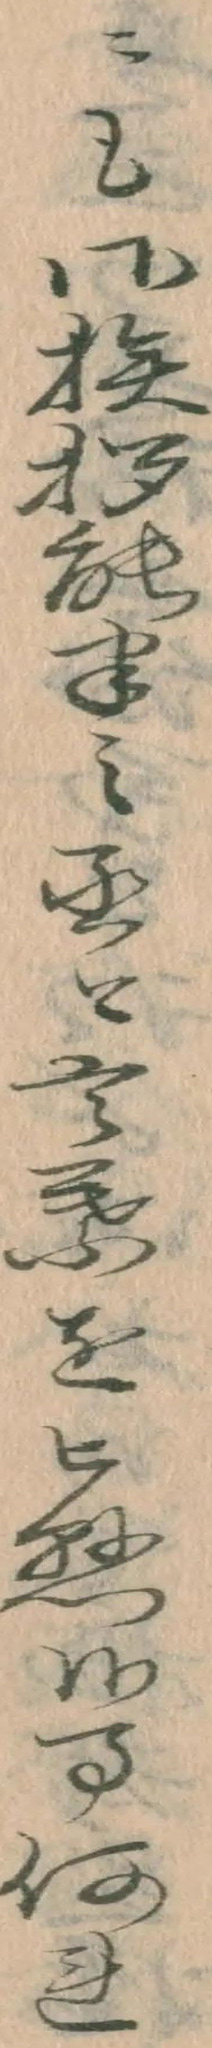にも御挨拶能半之丞と言葉を被懸候事何連
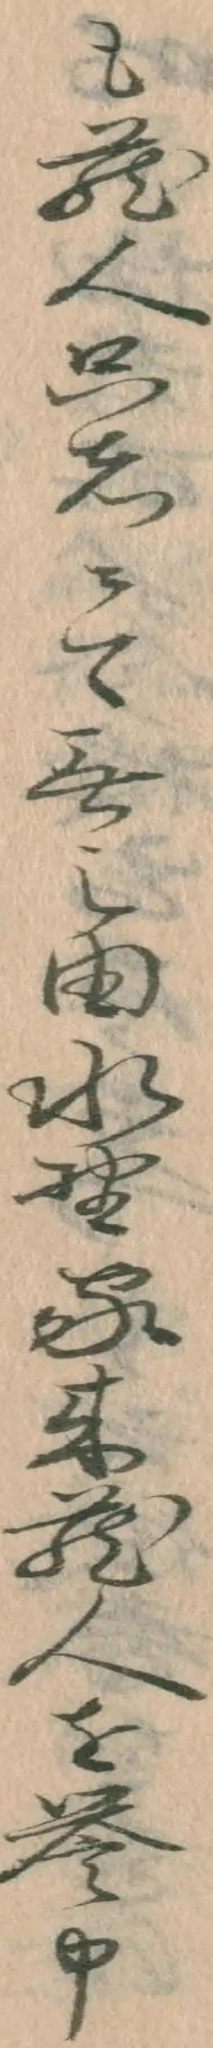も蔵人只者にて無之由水野家来蔵人を誉申
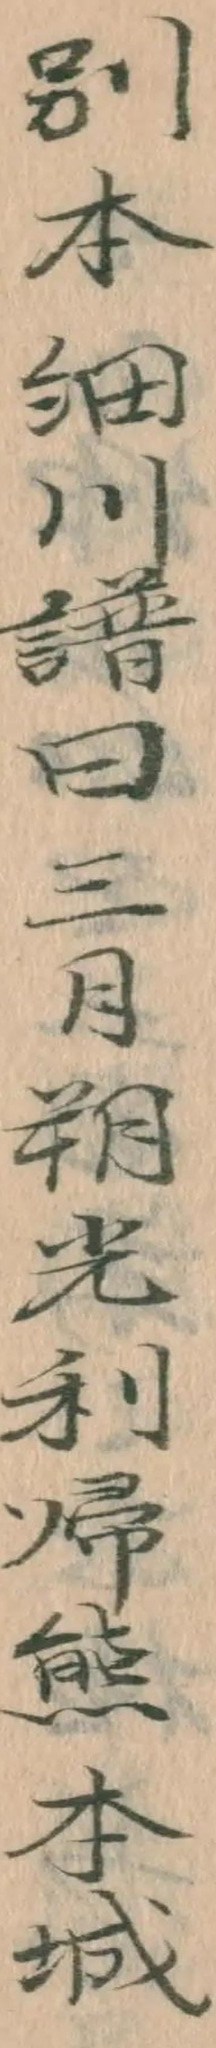別本細川譜曰三月朔光利帰熊本城
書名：切支丹御退治記 49巻. [9]
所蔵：国立国会図書館 National Diet Library, JAPAN
